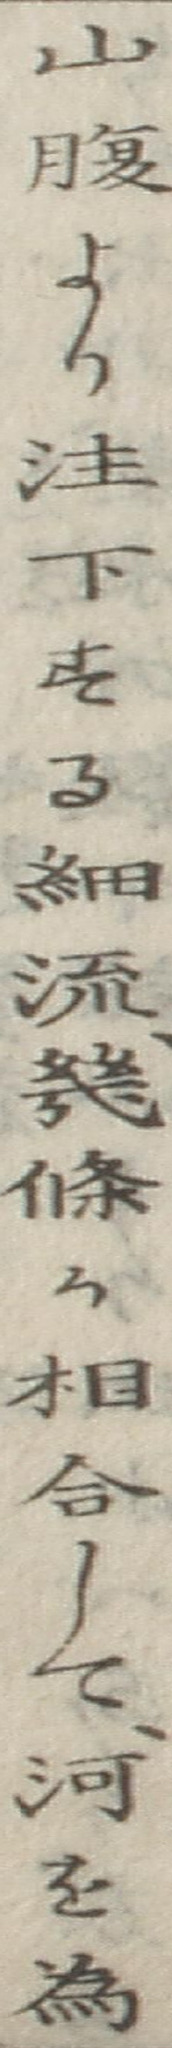山腹より注下する細流、幾條か相合して、河を為
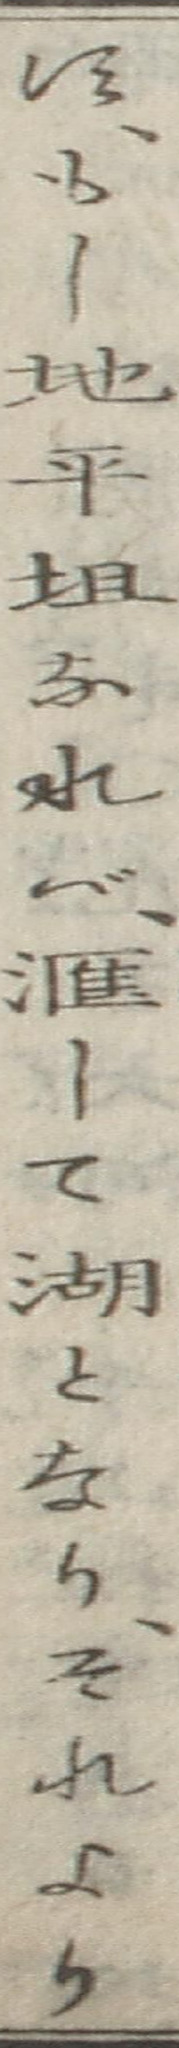す、もし地平坦なれば、滙して湖となり、それより

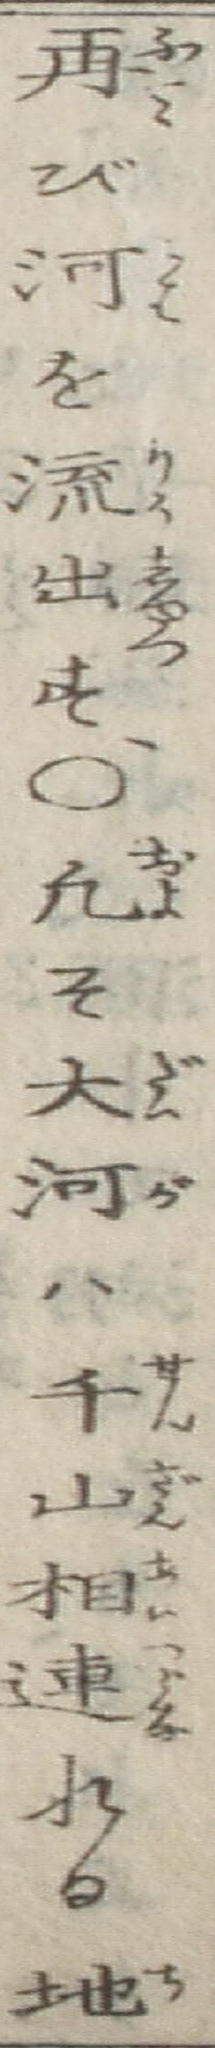再に河を流出す、〇凡そ大河は千山相連れる地
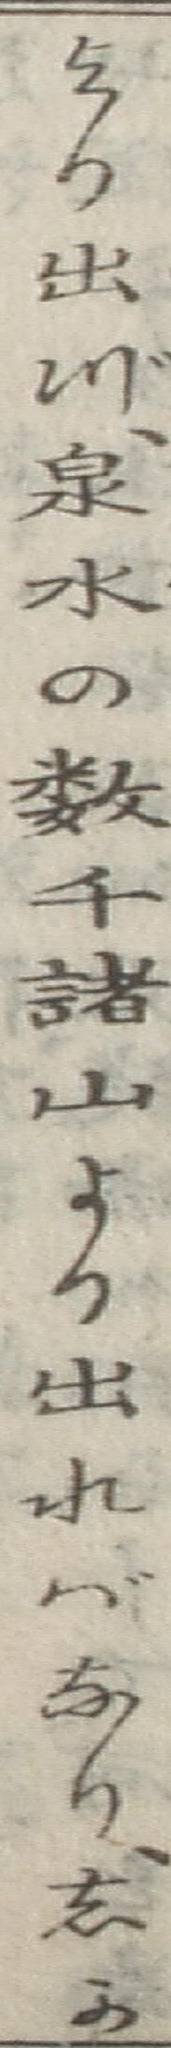より出づ、泉水の数千諸山より出ればなり、しか
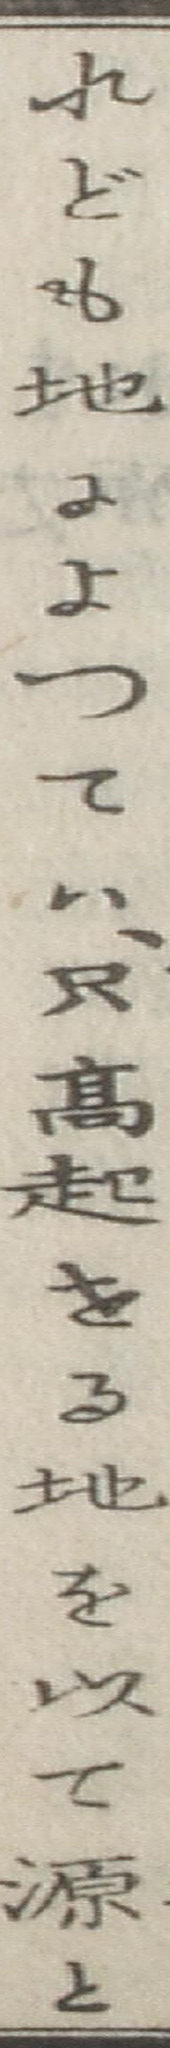れども地によつては、只高起せる地を以て源と
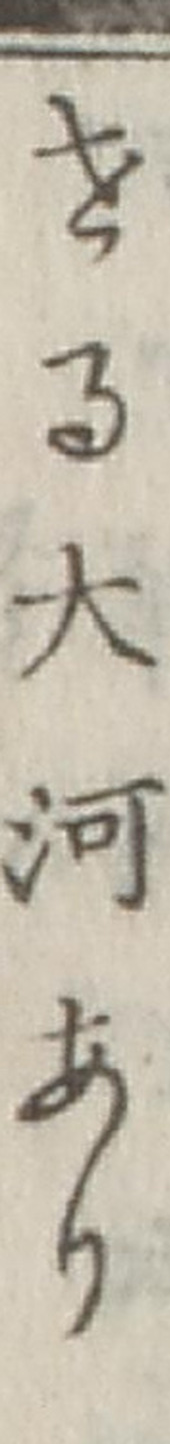せる大河あり
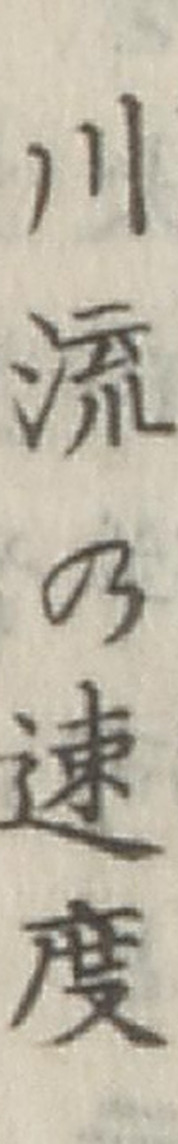川流の速度
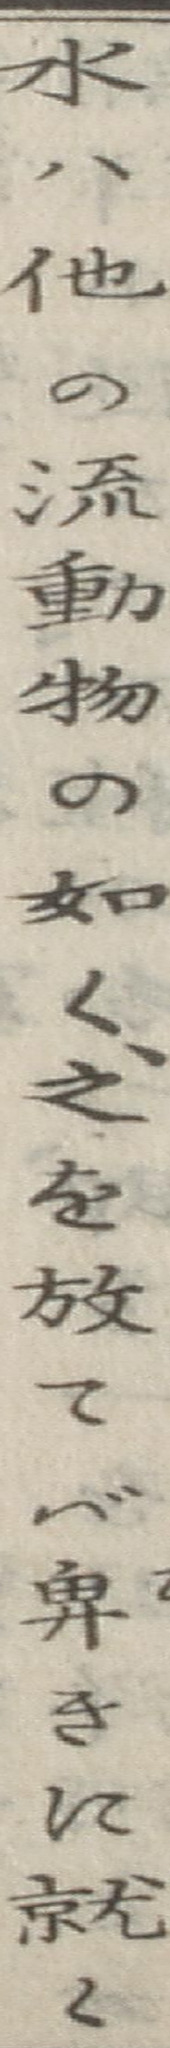水は他の流動物の如く、之を放ては卑きに就く
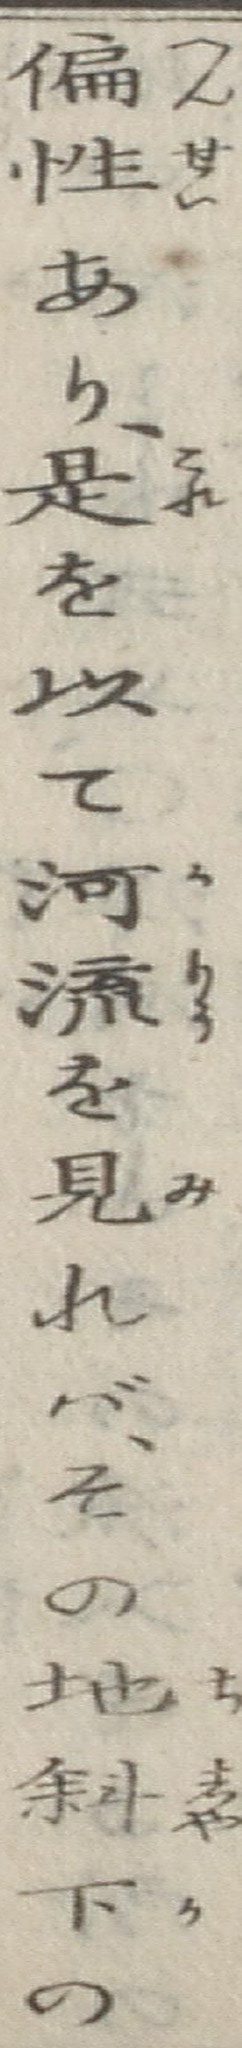偏性あり、是を以て河流を見れば、その地斜下の
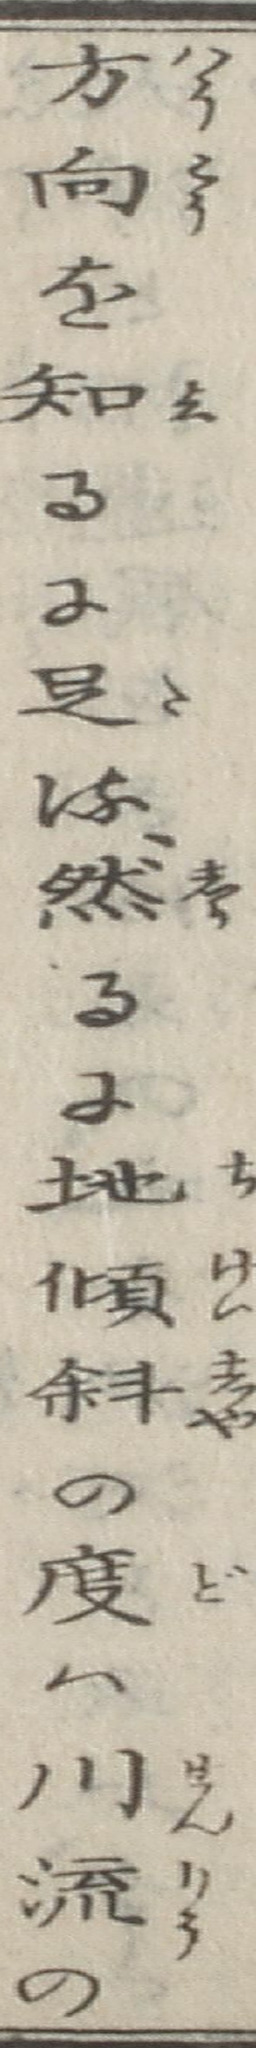方向を知るに足る、然るに地傾斜の度は川流の
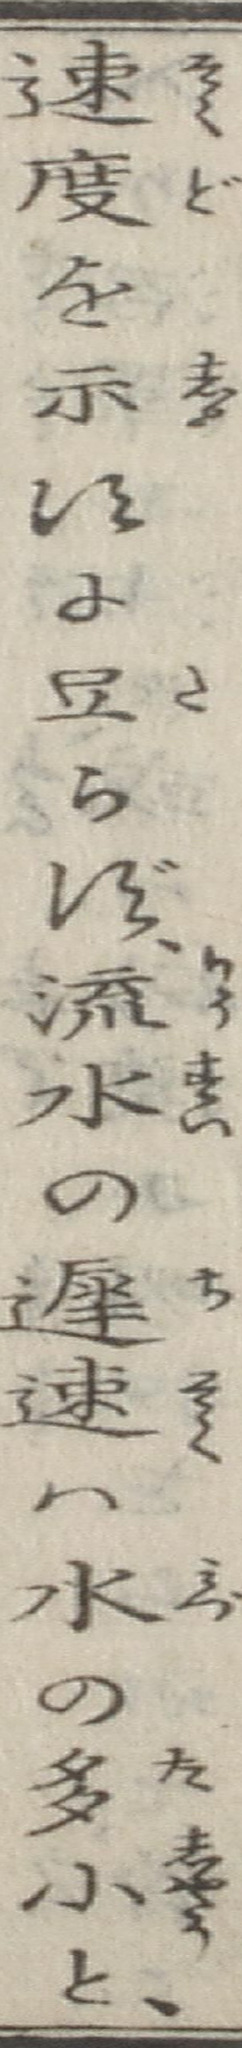速度を示すに足らず、流水の遅速は水の多小と、
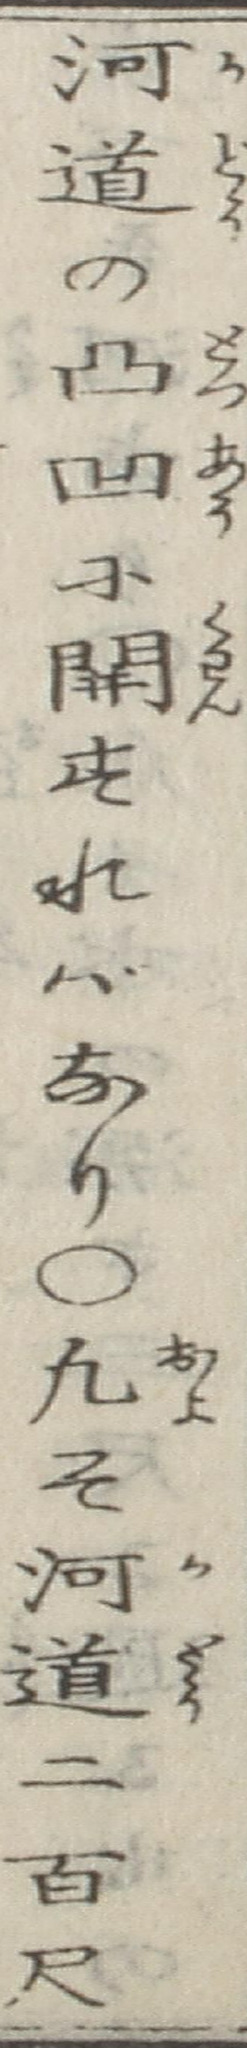河道の凸凹に関すればなり〇凡そ河道二百尺
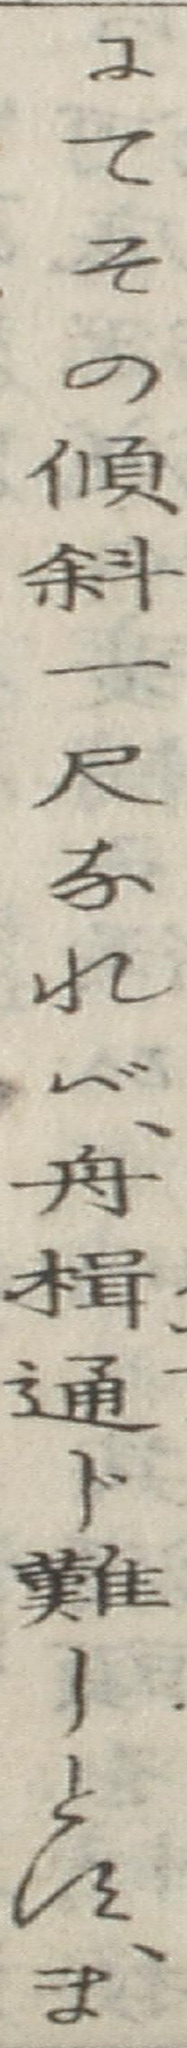にてその傾斜一尺なれば、舟楫通じ難しとす、ま
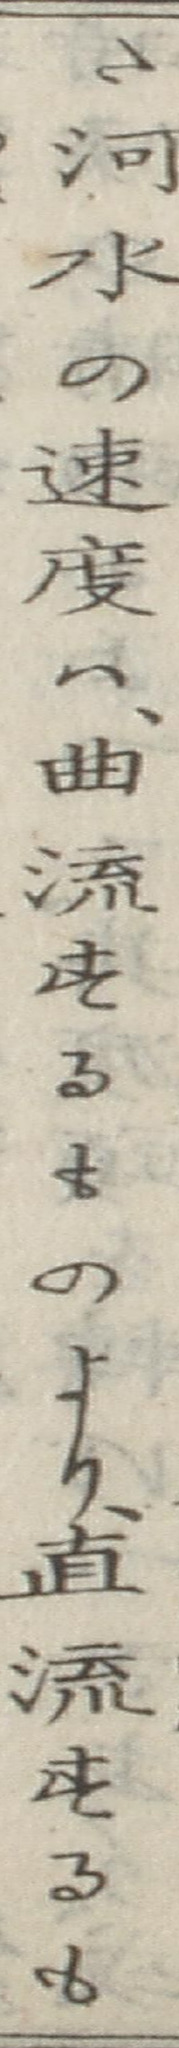た河水の速度は、曲流するものより、直流するも
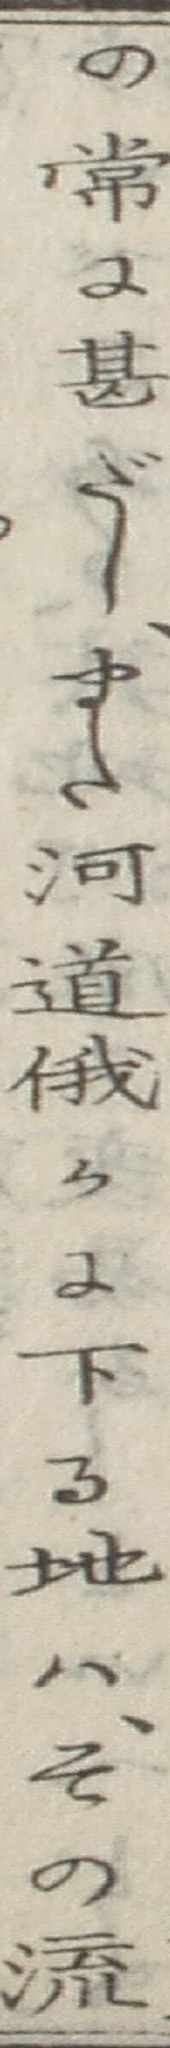の常に甚だし、また河道俄かに下る地は、その流
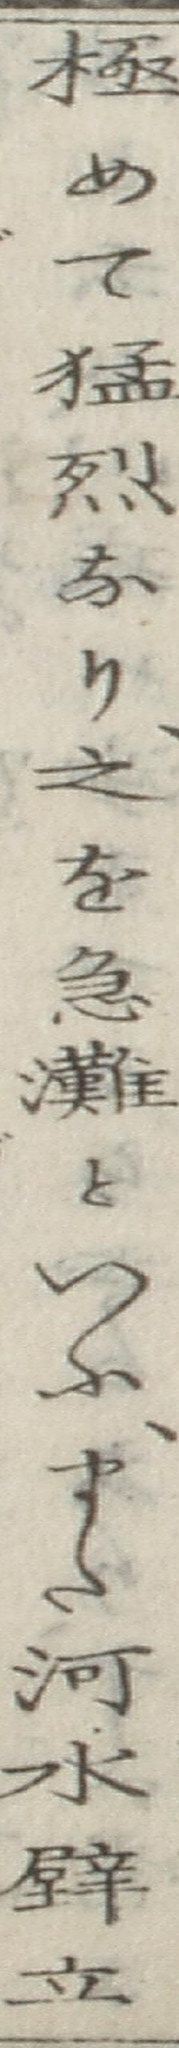極めて猛烈なり、之を急灘といす、また河水壁立
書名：訓蒙　天然地理學　中
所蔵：東京大学地震研究所図書室 Earthquake Research Institute Library, The University of Tokyo, JAPAN
